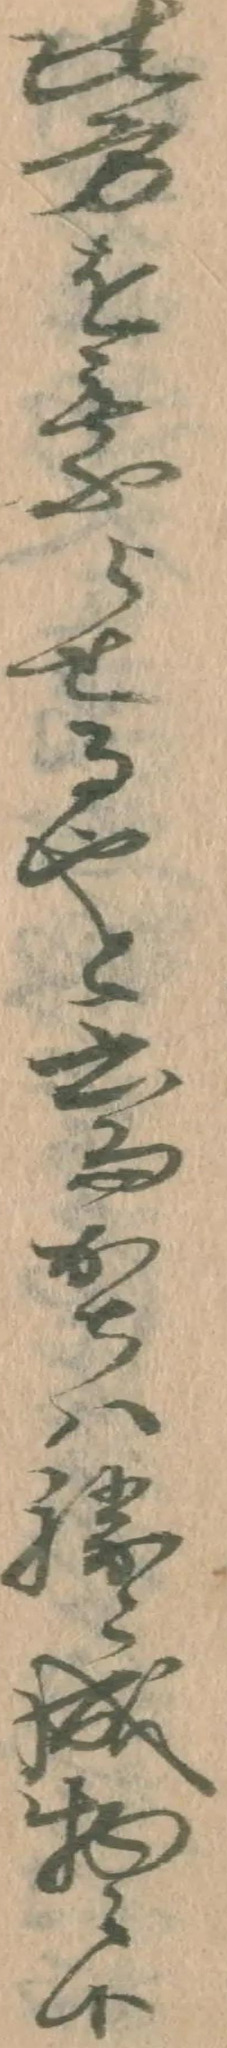此方を乗らせると云而かちは勝に成物に候
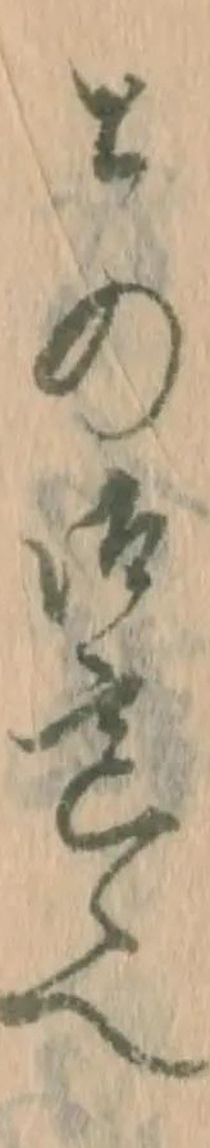との御意也
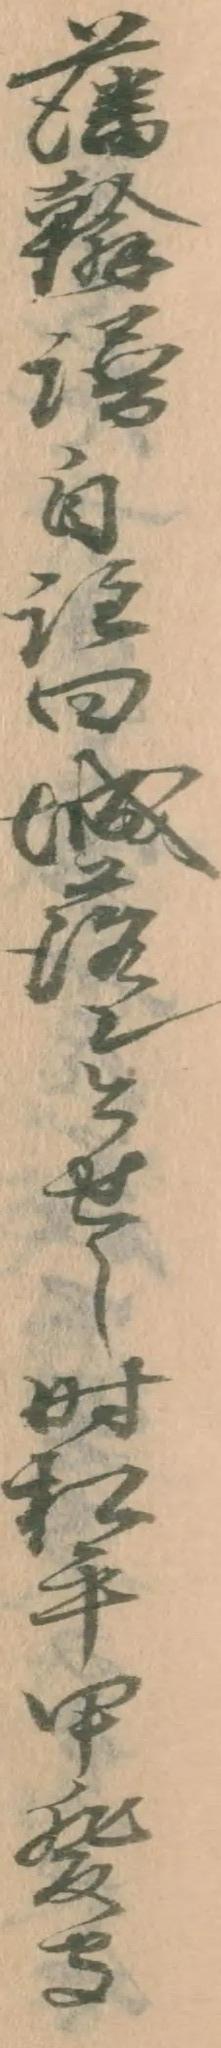藩翰譜自注曰城落しとせし時松平甲斐守
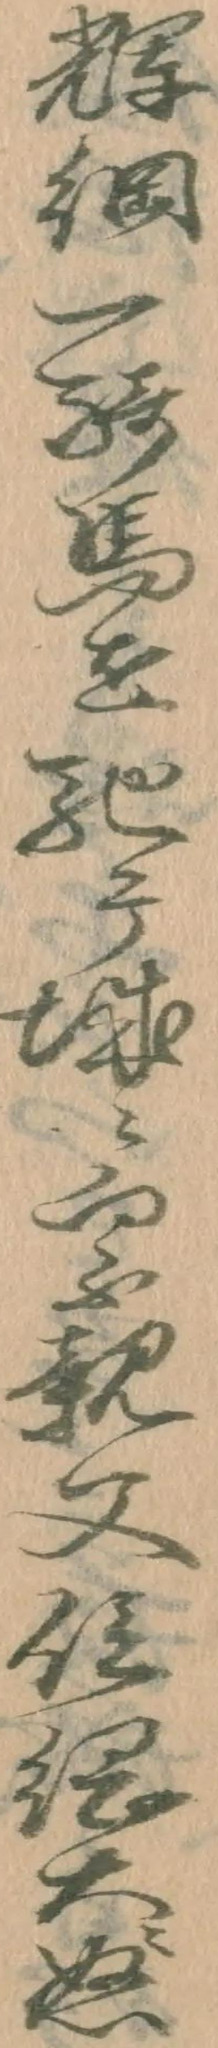輝綱一騎馬を馳て城に向ふ親父信綱大に怒
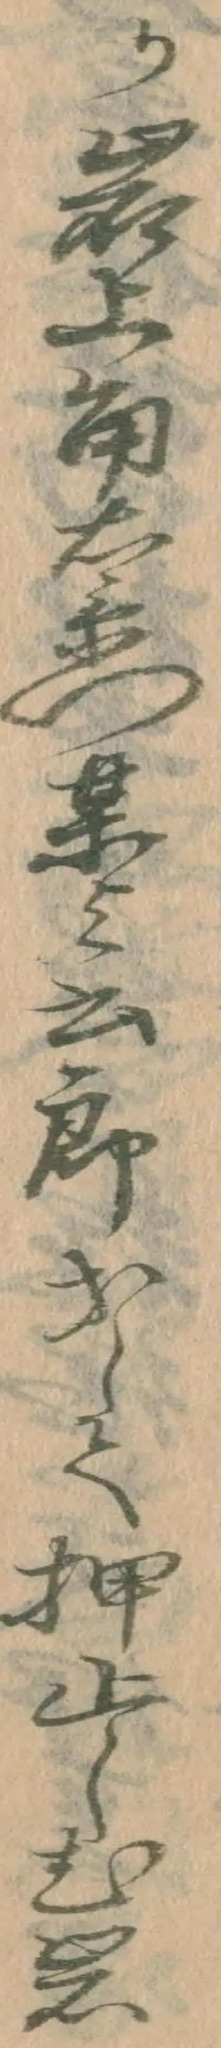り岩上角右衛門某与云郎等して押止しむ岩
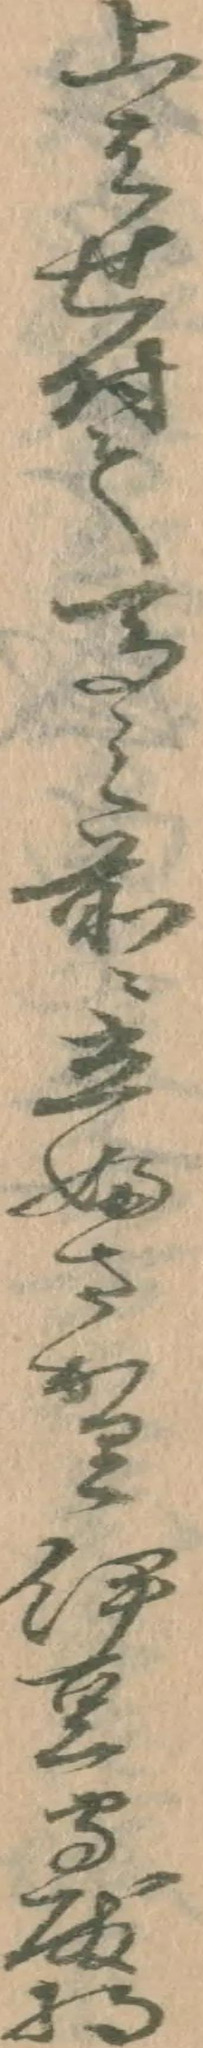上者せ付て馬之前に立婦さか里伊豆守殿将
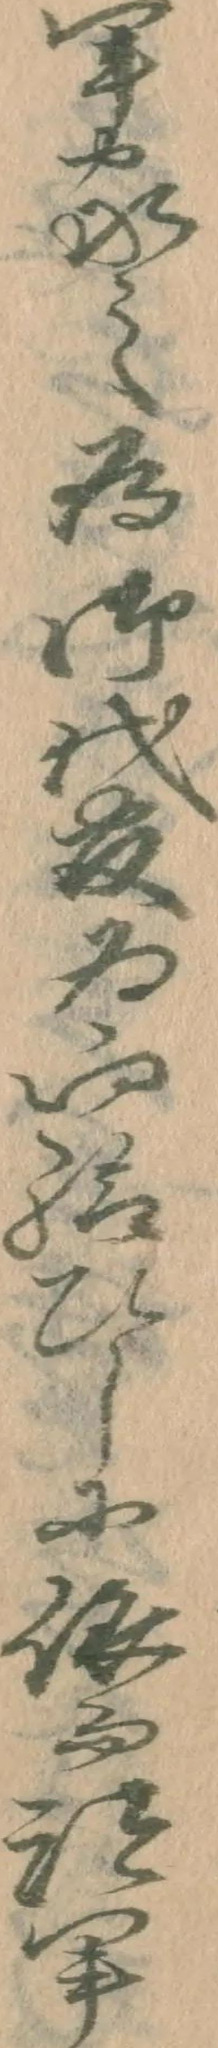軍家之為御代官為無句給ひし尓依而諸軍
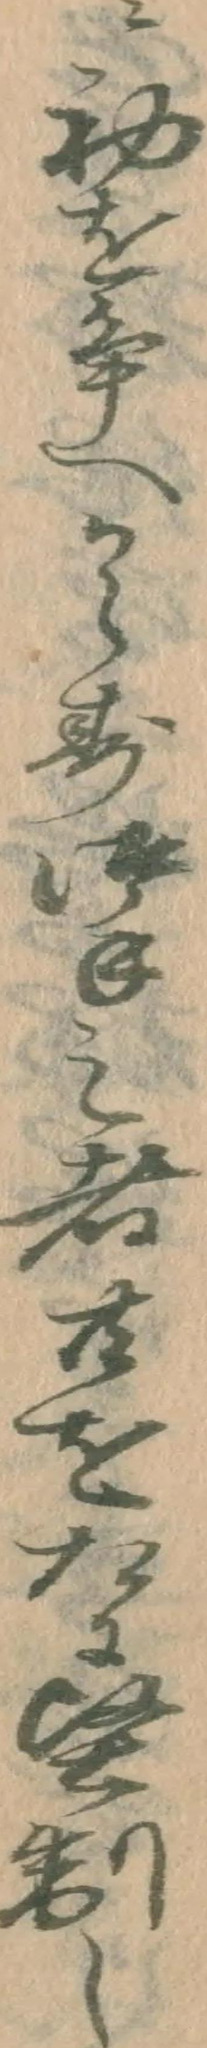に初を争へかし寄御手之者共をた尓堅制し
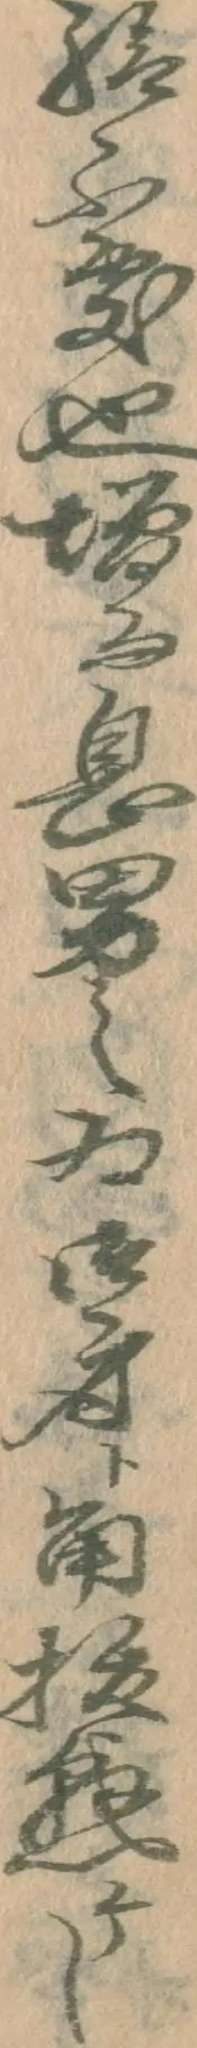給ふ處也増而息男之為御身と角抜懸けし
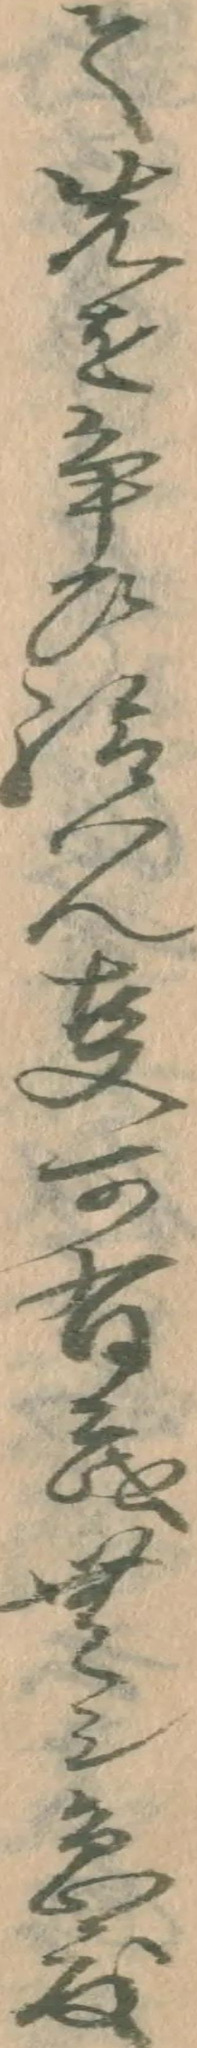て先を争ひ給はん事可有茂無し急度
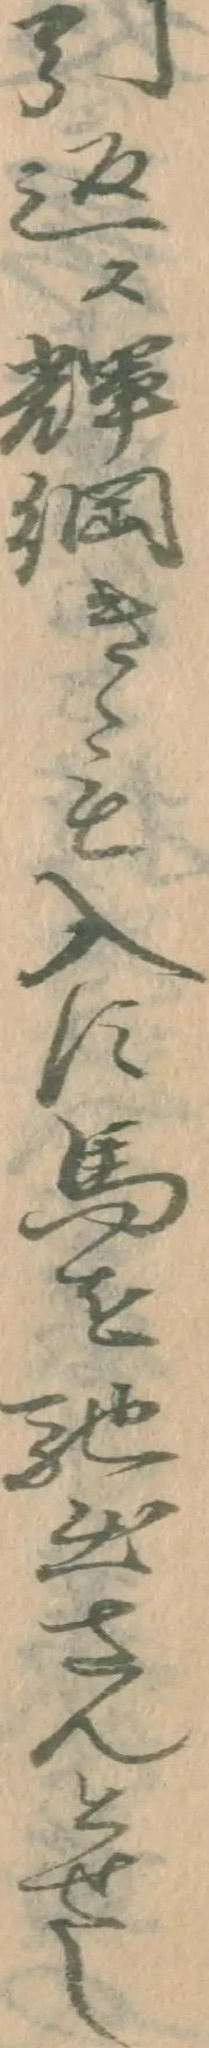引返す輝綱きゝも入須馬を馳出さんとせし

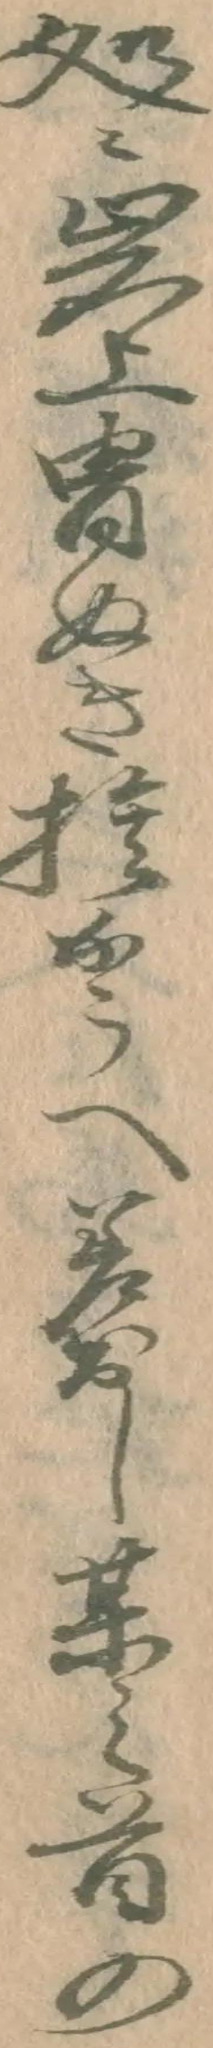処に岩上冑ぬき捨からへ差出し某之首の
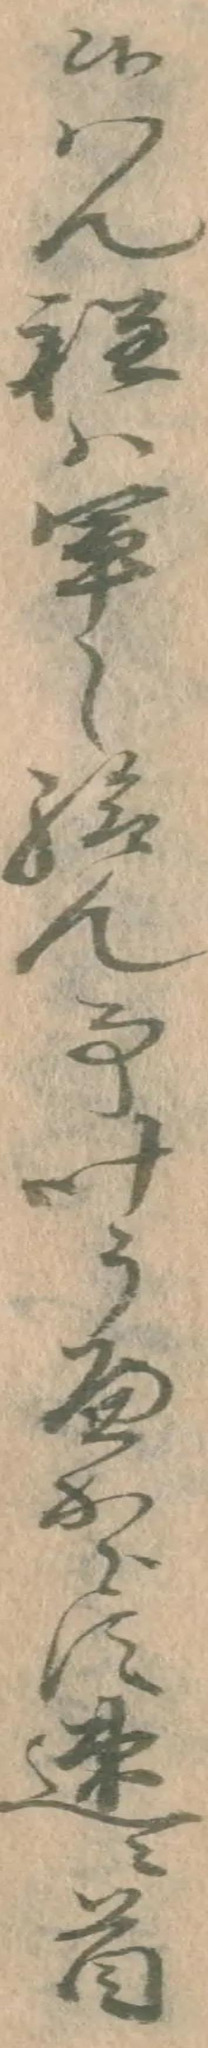候はん程は軍之給ん事叶う扁から須速に首
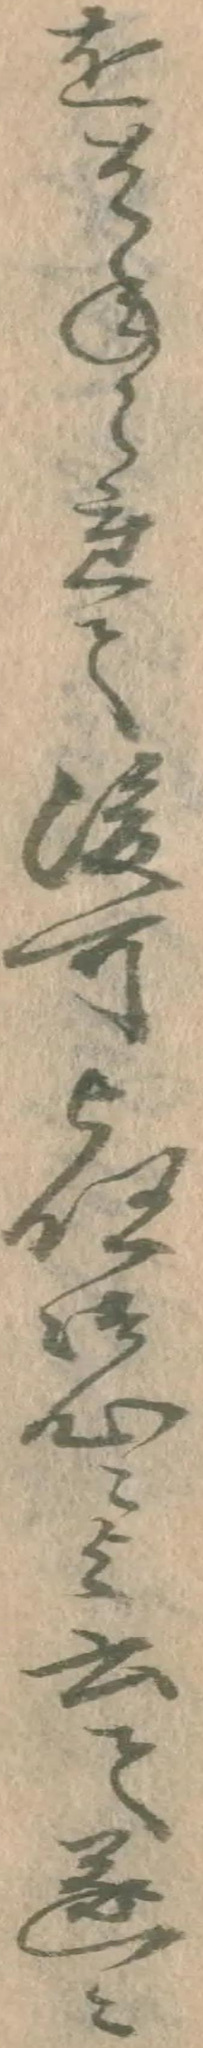を者手ら連て後可被任御心に与云て遂に
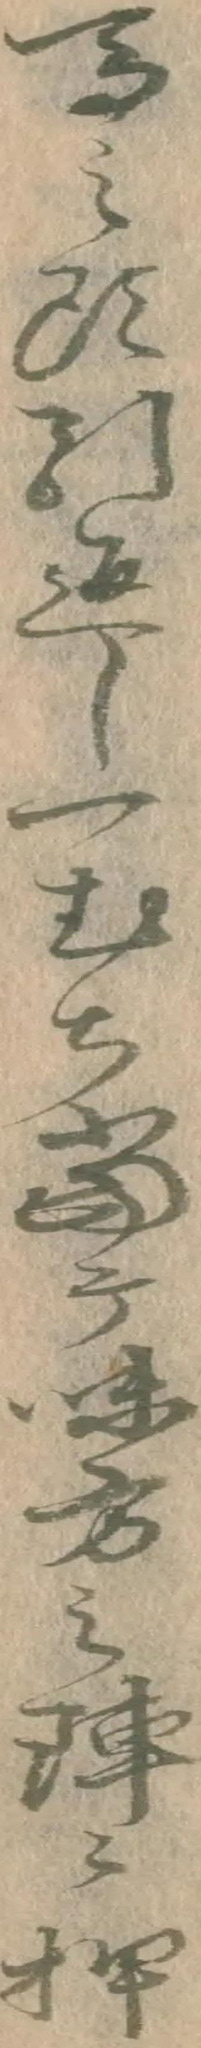馬之頭引返し一むち当て味方之陣に押
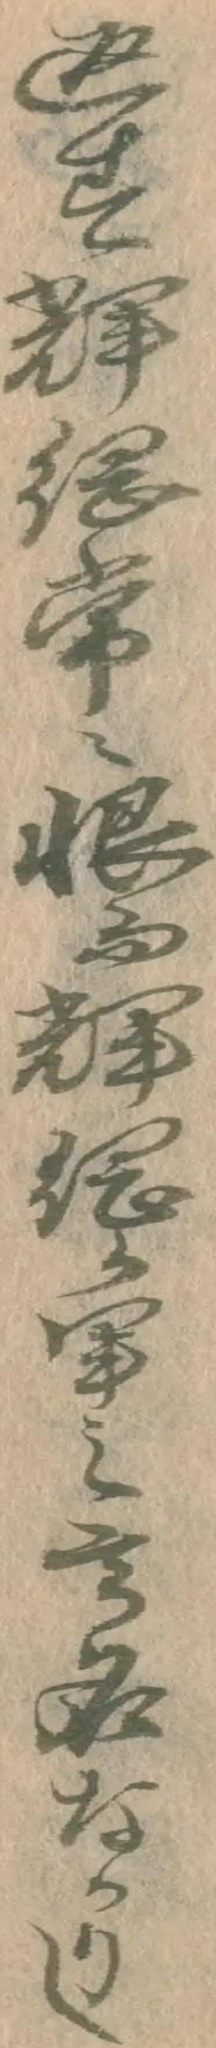返春輝綱常に恨而輝綱か軍之高名なかりし
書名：切支丹御退治記 49巻. [8]
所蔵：国立国会図書館 National Diet Library, JAPAN
